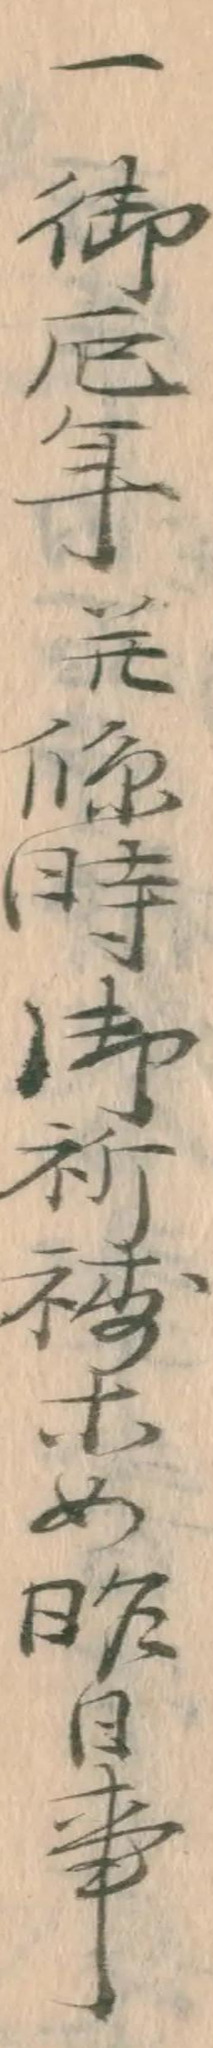一御厄年并臨時御祈祷等如昨日事
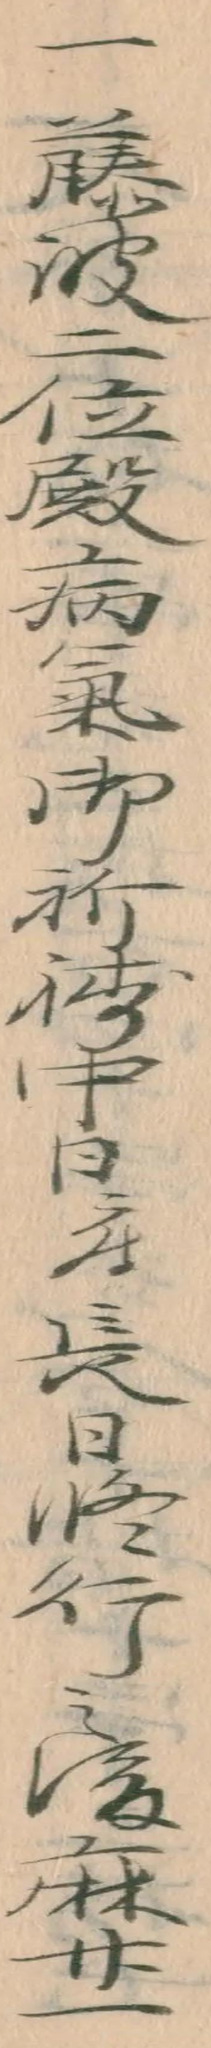一藤波二位殿病氣御祈祷中日ニ付長日修行之後麻廿一
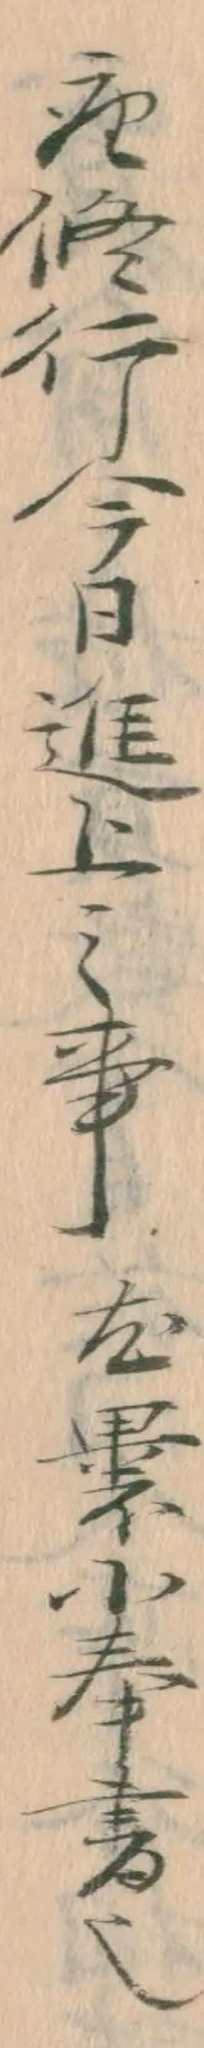座修行今日進上之事尤褁小奉書也
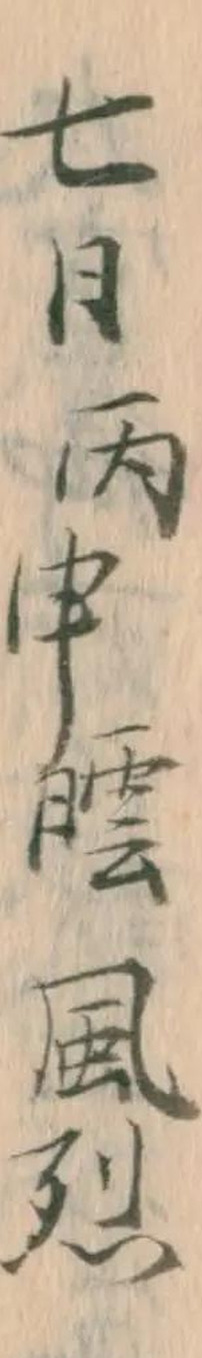七日丙申曇風烈
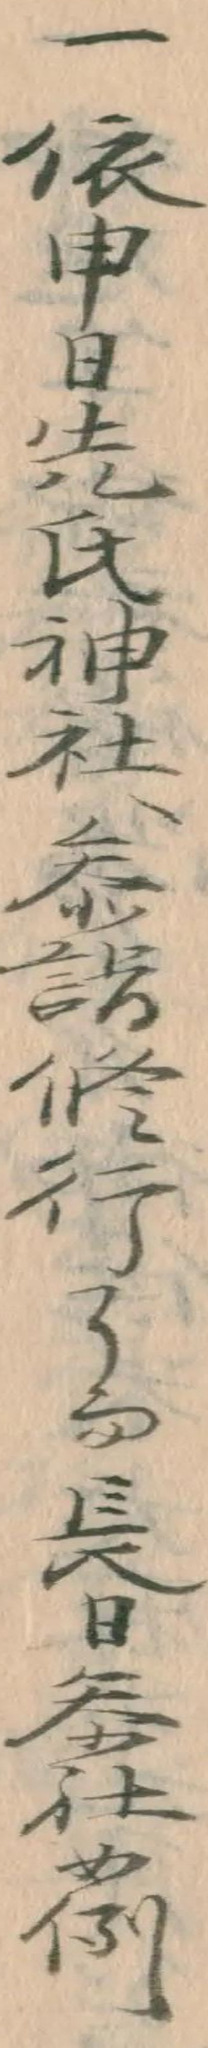一依申日先氏神社へ参詣修行了而長日参社如例
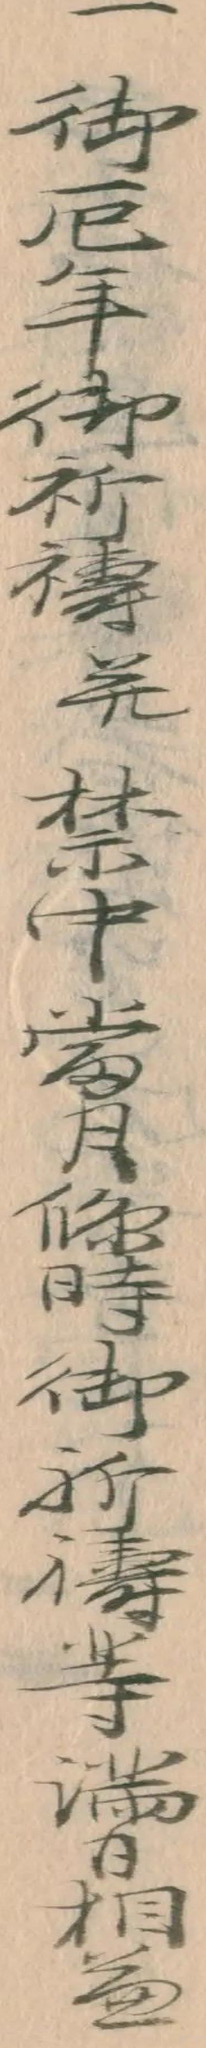一御厄年御祈祷幷禁中當月臨時御祈禱等満日相兼
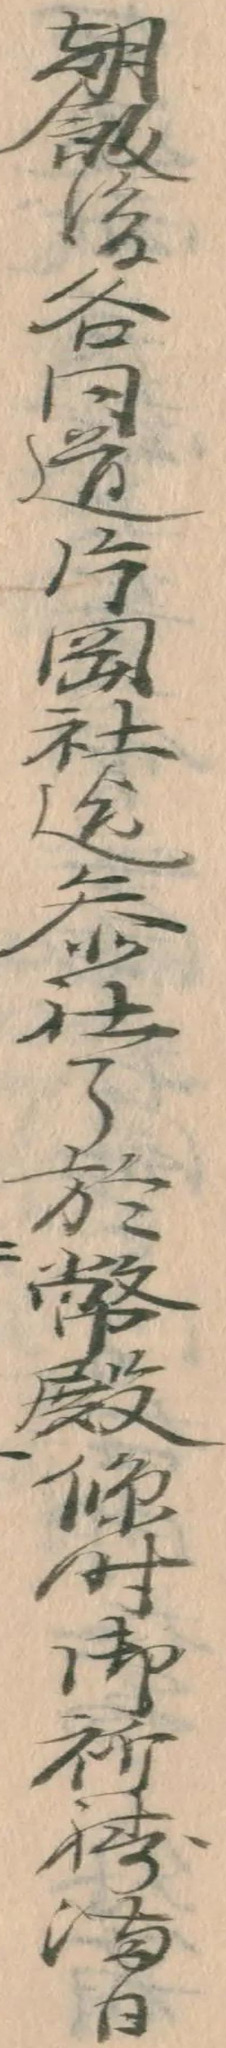朝飯後各同道片岡社迄参社了於常殿臨時御祈祷満日
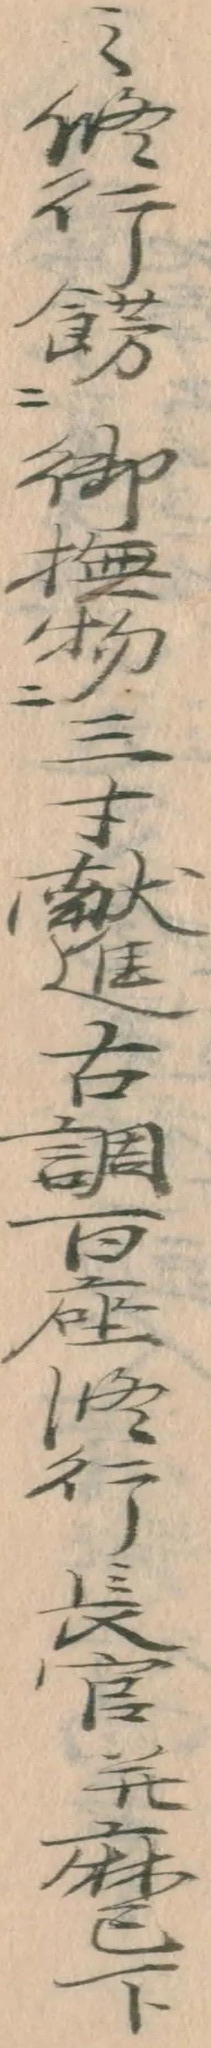之修行餝御撫物三寸献進古調百座修行長官幷麻已下
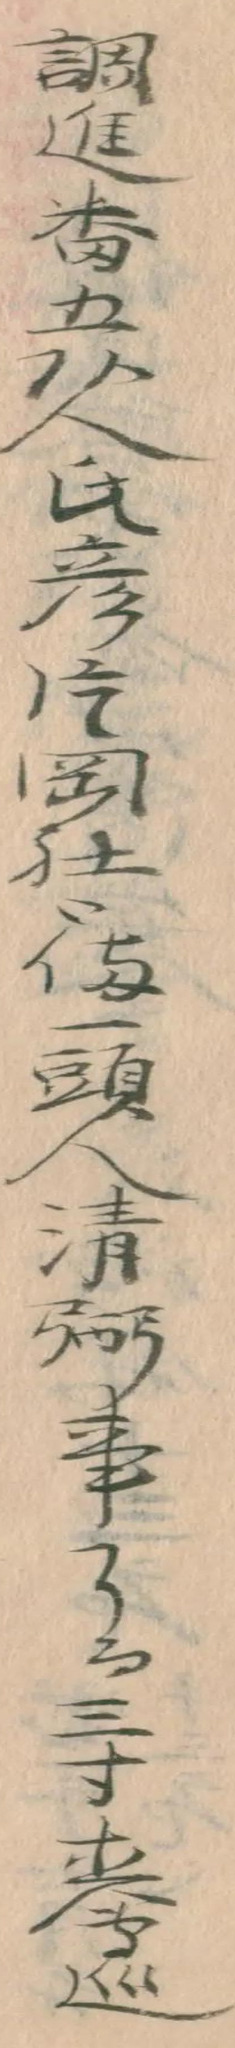調進番五頭人氏彦片岡社御備一頭人清弼事了而三寸直會巡
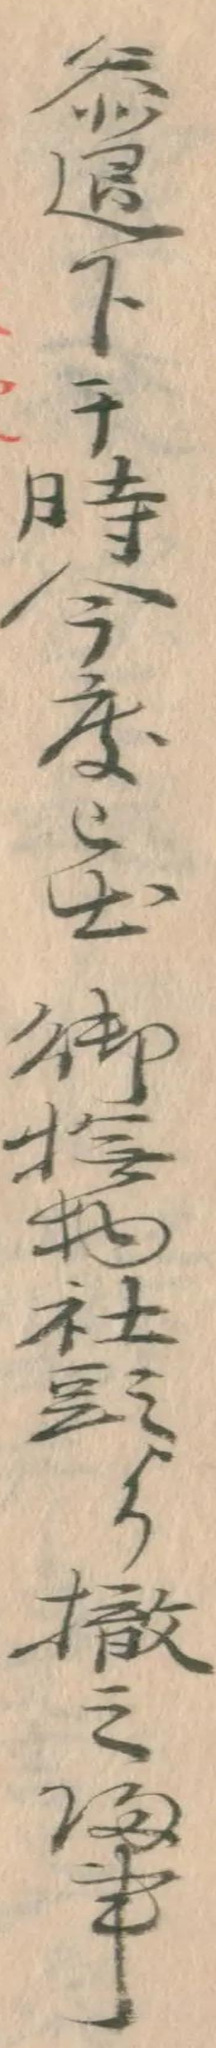参退下于時今度被出御撫物社頭より撤之帰事
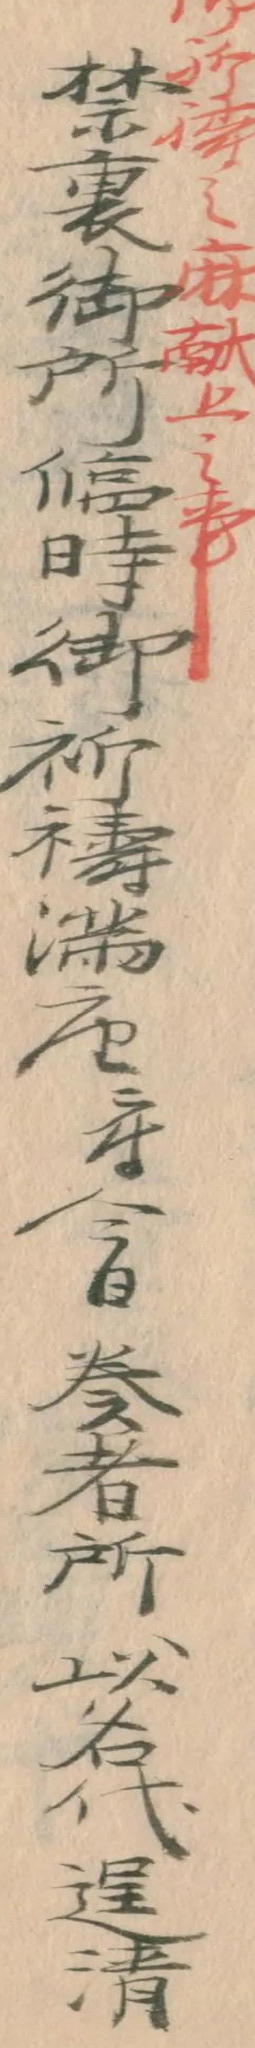一禁裏御所臨時御祈祷満座ニ付今日奏者所ヘ以名代逞清
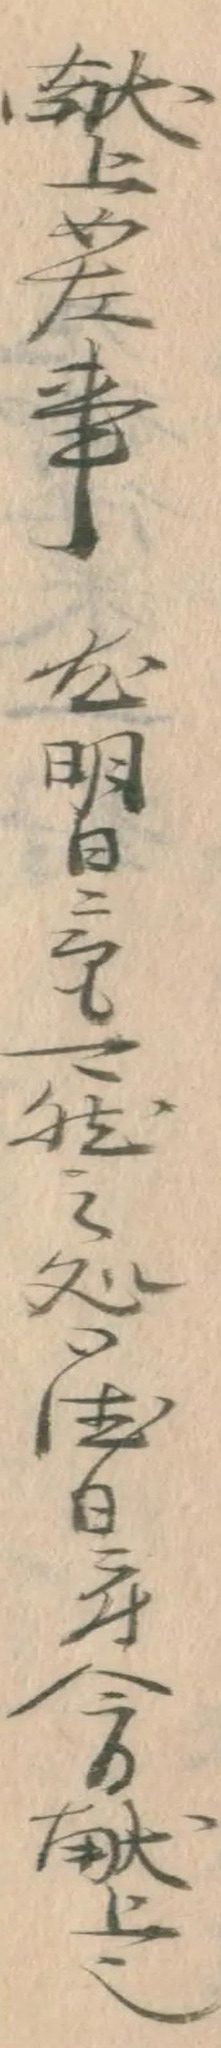献上如左事尤明日ニ而も可然之処御徳日ニ付今日献上也
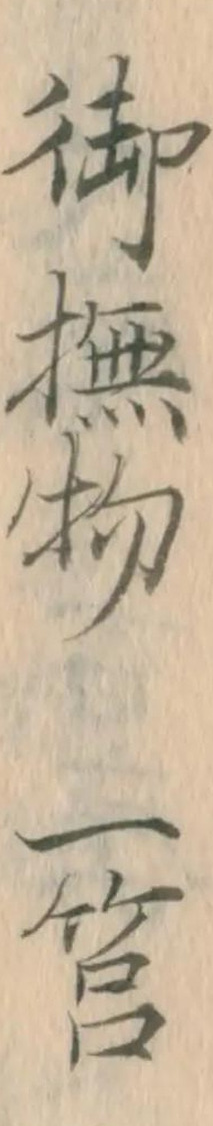御撫物一筥

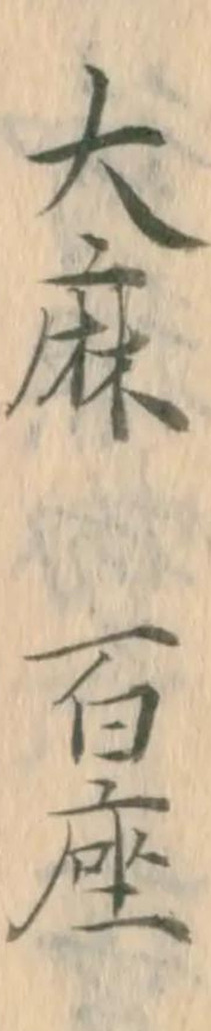大麻百座
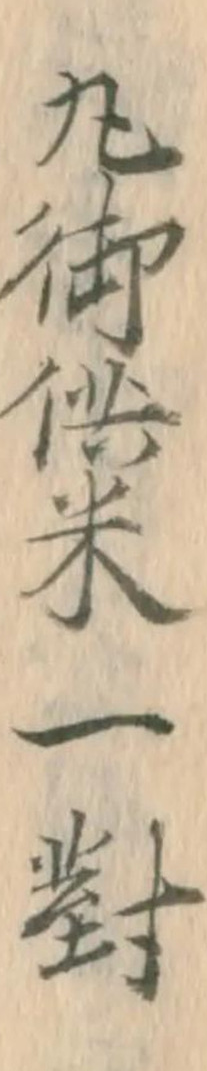丸御供米一對
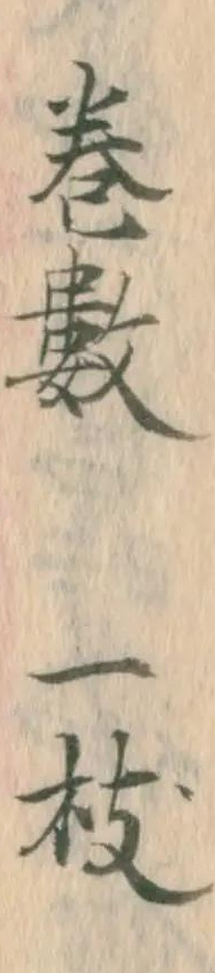巻数一枝
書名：賀茂社記録. 第74冊
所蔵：国立国会図書館 National Diet Library, JAPAN
